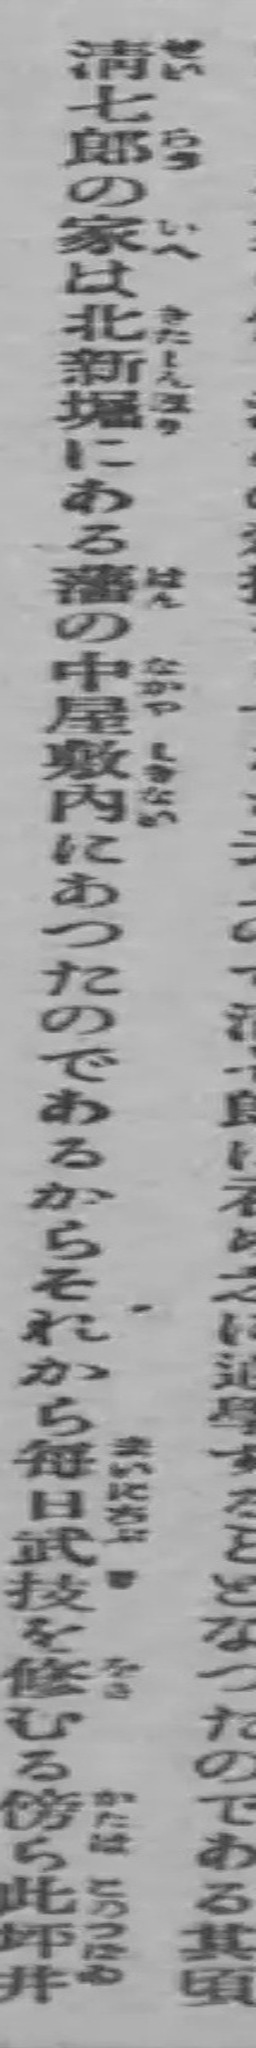清七郎の家は北新堀にある藩の中屋敷内にあつたのであるからそれから毎日武技を修むる傍ら此坪井
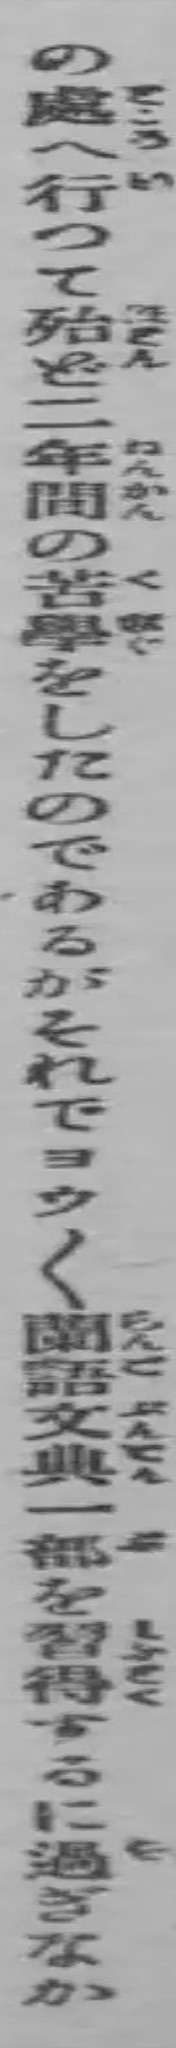の処へ行つて殆ど二年間の苦学をしたのであるがそれでヨウ〳〵蘭語文典一部を習得するに過ぎなか
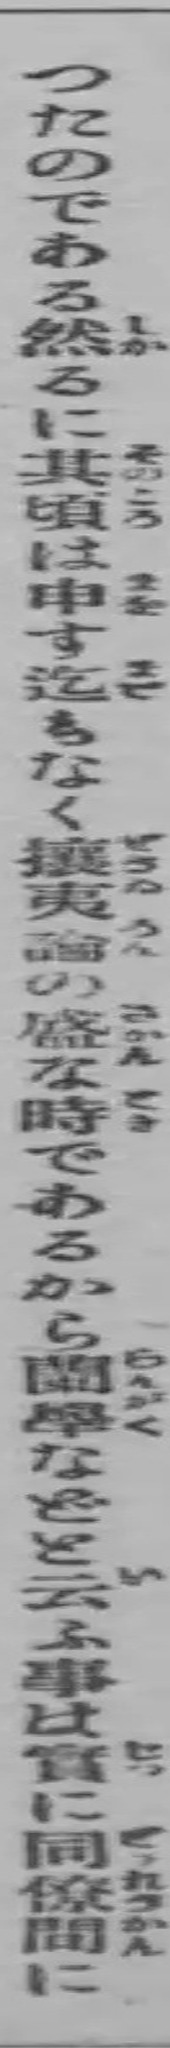つたのである然るに其頃は申す迄もなく攘夷論の盛な時であるから蘭学などと云ふ事は実に同僚間に
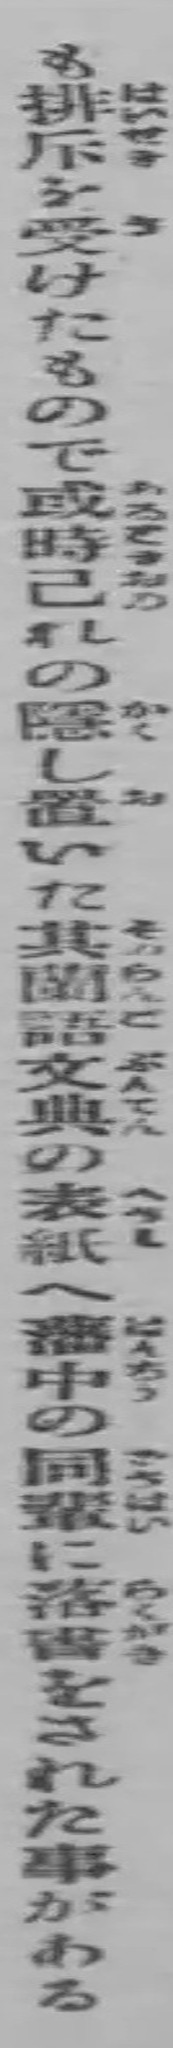も排斥を受けたもので或時己れの隠し置いた其蘭語文典の表紙へ藩中の同輩に落書をされた事がある
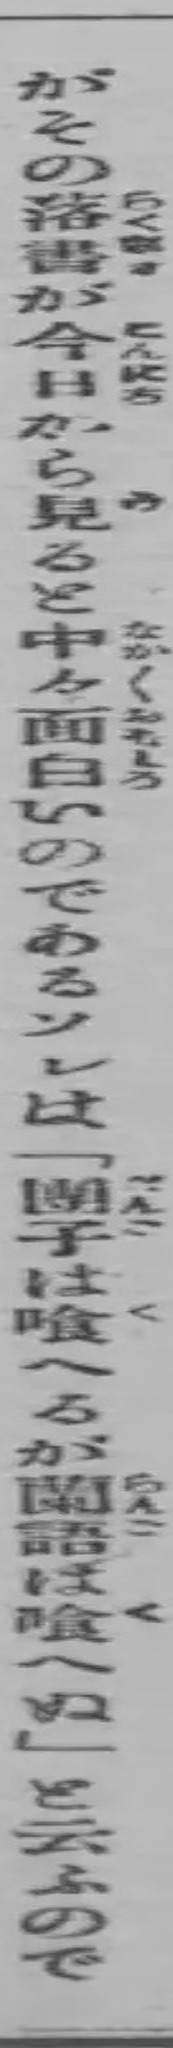がその落書が今日から見ると中々面白いのであるソレは「団子は喰へるが蘭語は喰へぬ」と云ふので
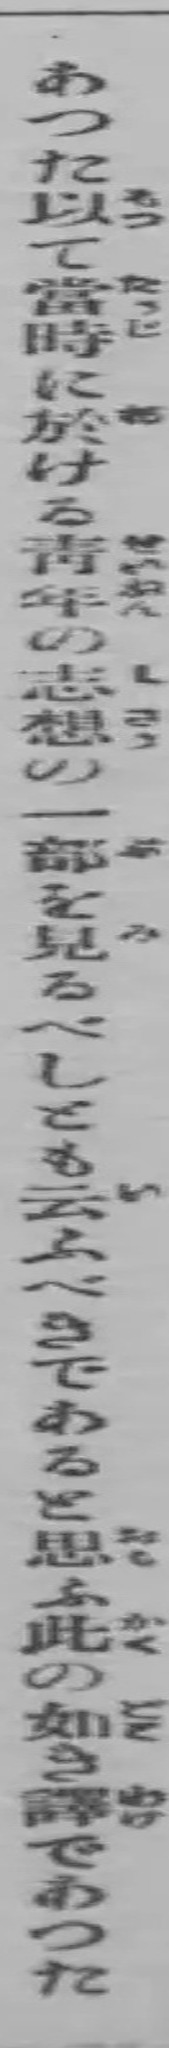あつた以て当時に於ける青年の志想の一部を見るべしとも云ふべきであると思ふ此の如き訳であつた
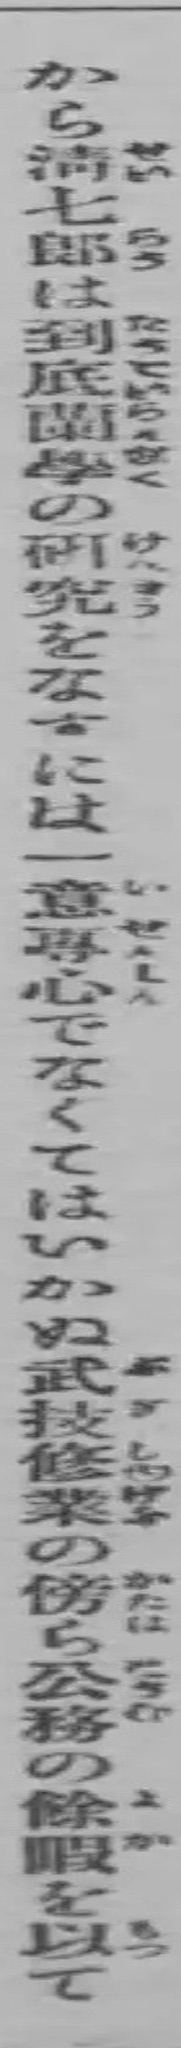から清七郎は到底蘭学の研究をなすには一意専心でなくてはいかぬ武技修行の傍ら公務の余暇を以て
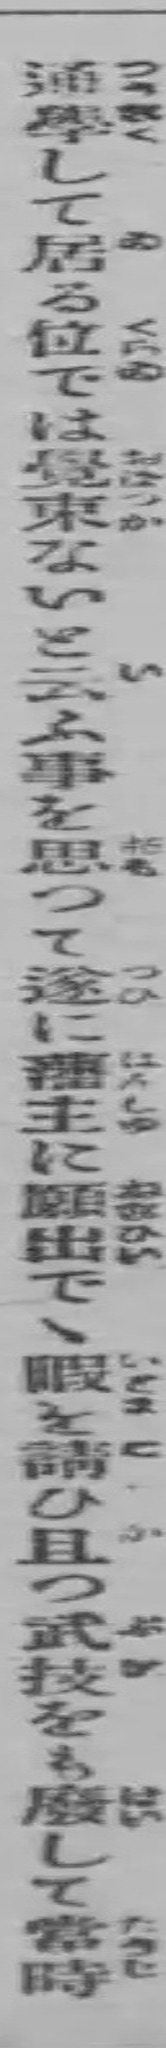通学して居る位では覚束ないと云ふ事を思つて遂に藩主に願出でゝ暇請ひ且つ武技をも廃して当時
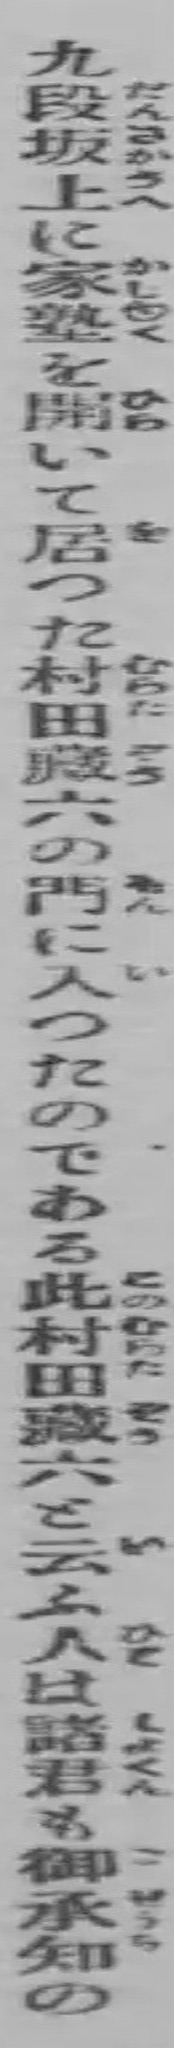村田蔵六九段坂上に家塾を開いて居つた村田蔵六の門に入つたのである此村田蔵六と云ふ人は諸君も御承知の
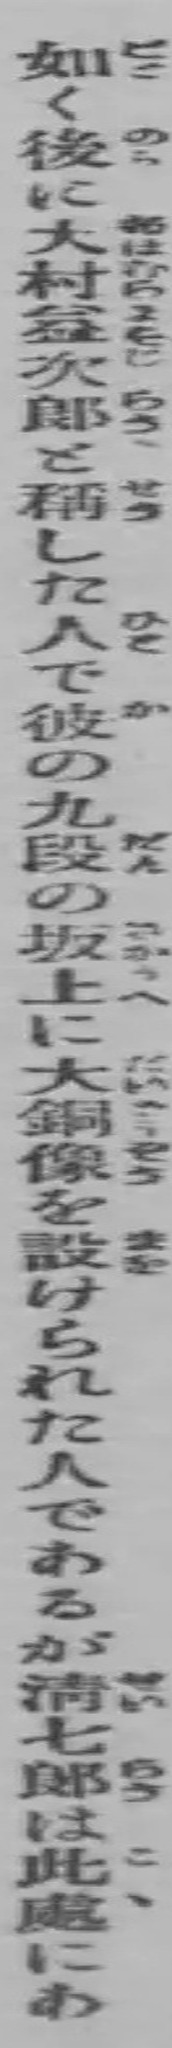如く後に大村益次郎と称した人で彼の九段の坂上に大銅像を設けられた人であるが清七郎は此処にあ
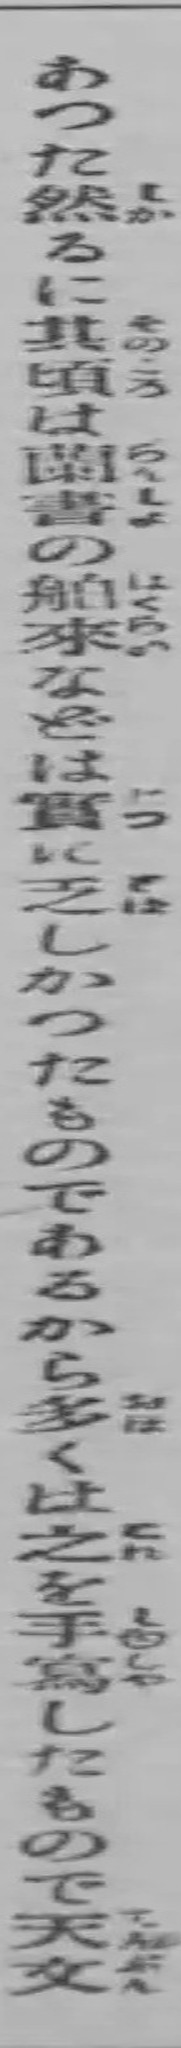あつた然るに其頃は蘭書の舶来などは実に乏しかつたものであるから多くは之を手写したもので天文
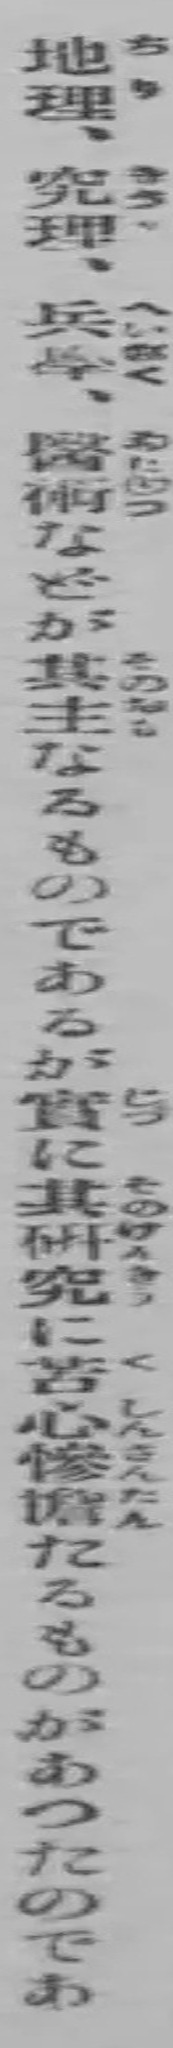地理、究理、兵学、医術などが其主なるものであるが実に其研究に苦心惨憺たるものがあつたのであ
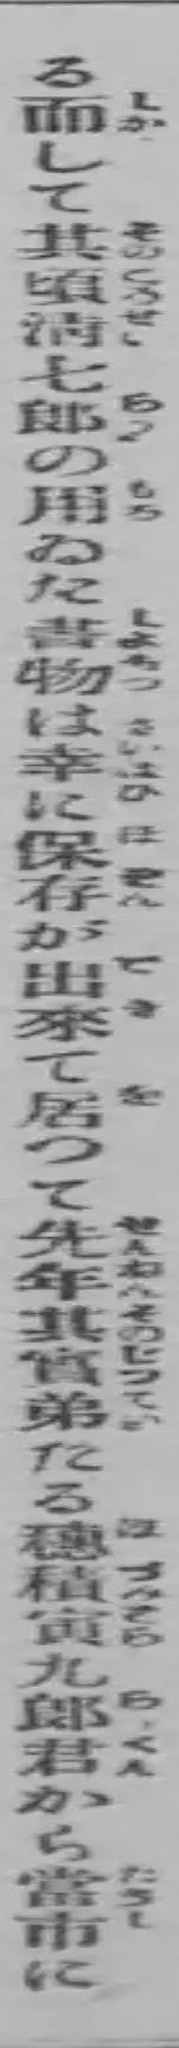る而して其頃清七郎の用ゐた書物は幸に保存が出来て居つて先年其実弟たる穂積寅九郎君から当市に
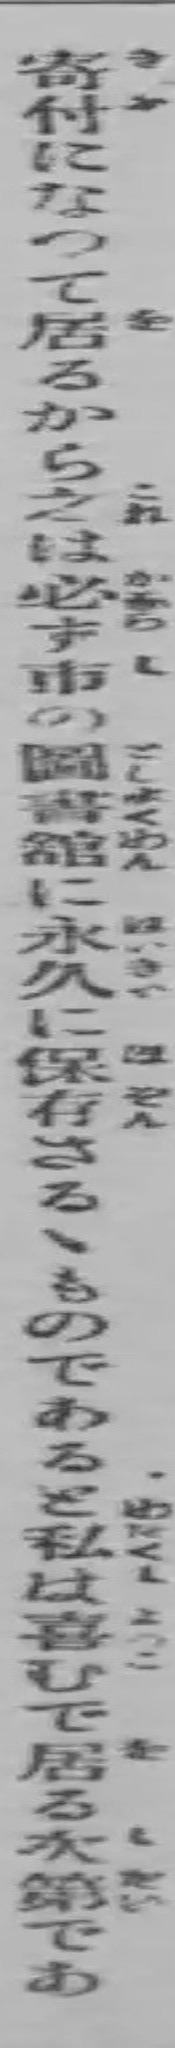寄付になつて居るから之は必ず市の図書館に永久に保存さるゝものであると私は喜むで居る次第であ
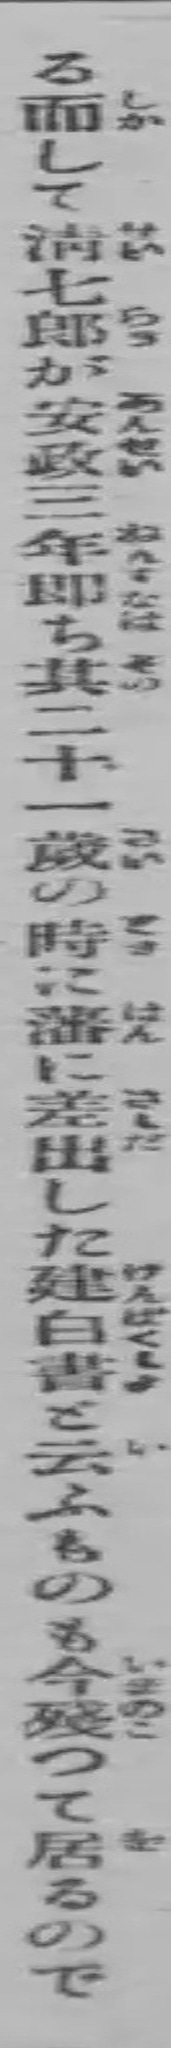る而して清七郎が安政三年即ち其二十一歳の時に藩に差出した建白書と云ふものも今残つて居るので
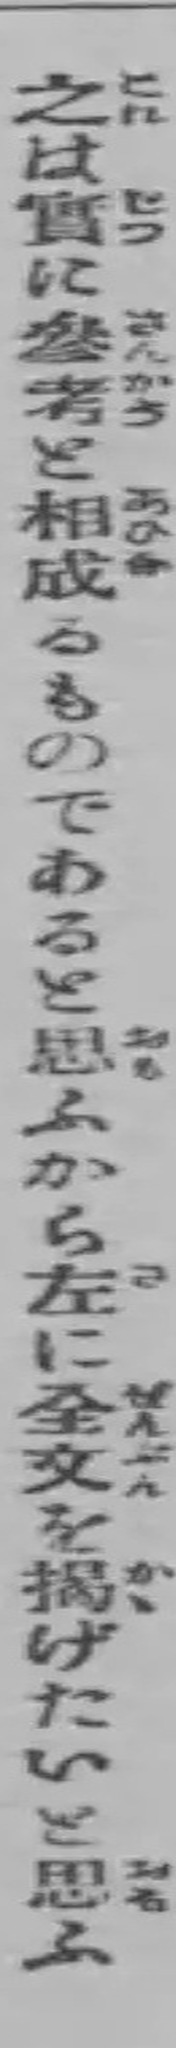之は実に参考と相成るものであると思ふから左に全文を掲げたいと思ふ
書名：豊橋市史談
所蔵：国立国会図書館 National Diet Library, JAPAN
